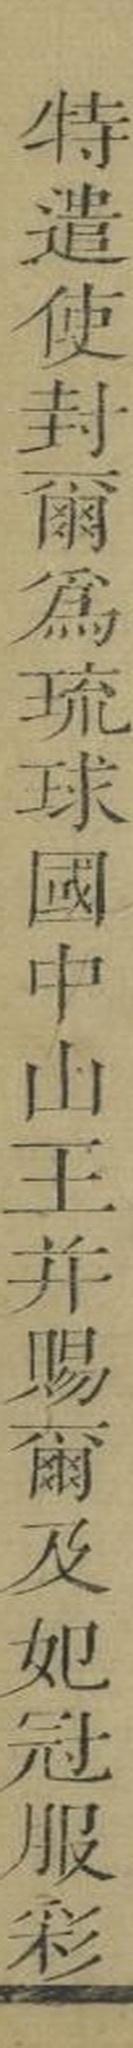特遣使封爾為琉球国中山王并賜爾及妃冠服彩

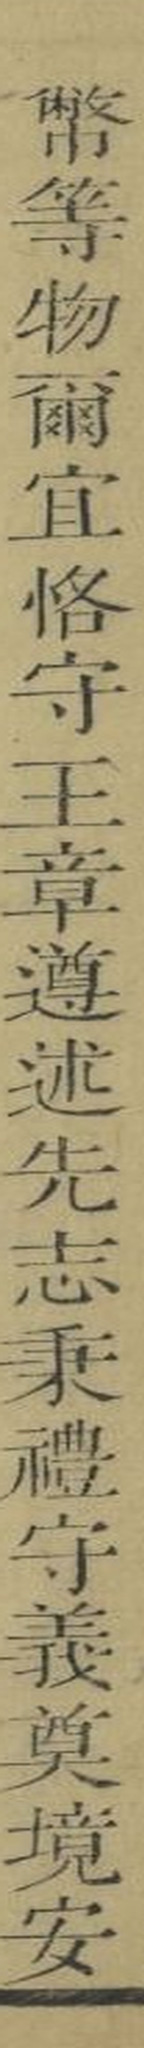幣等物爾宜恪守王章遵述先志秉礼守義奠境安
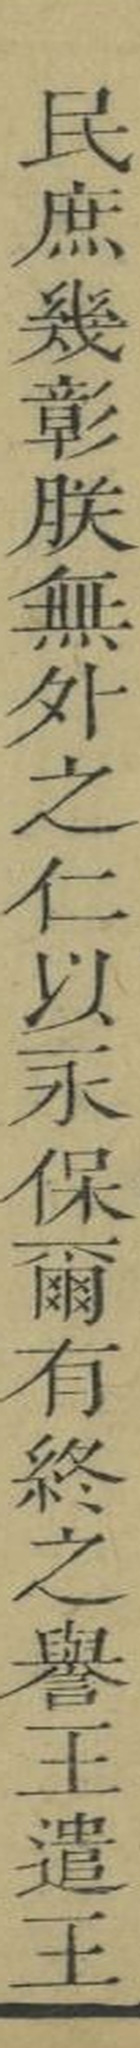民庶幾彰朕無外之仁以永保爾有終之誉王遣王
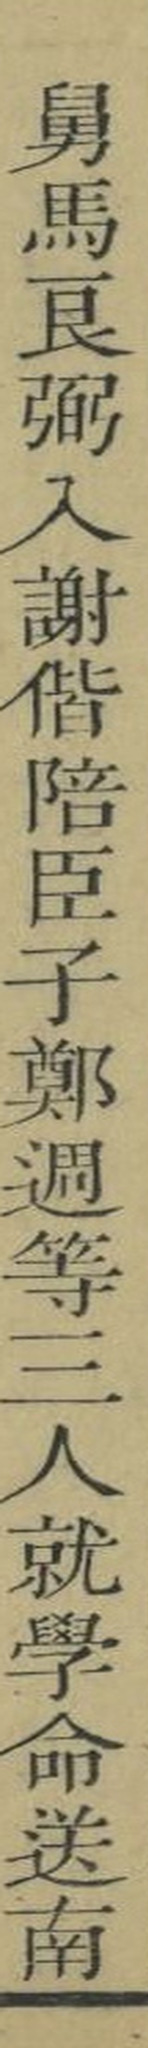舅馬良弼入謝偕陪臣子鄭週等三人就学命送南
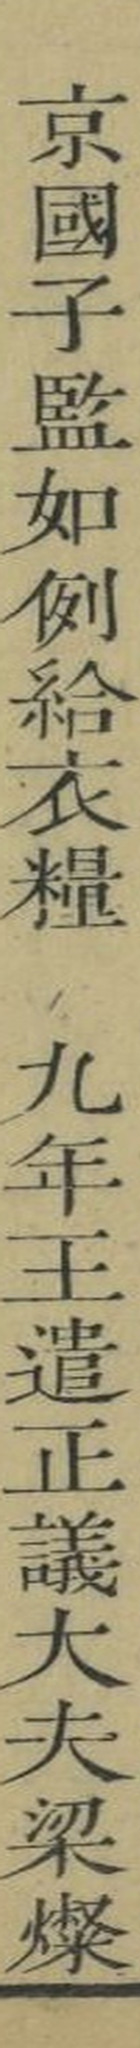京国子監如例給衣糧九年王遣正議大夫梁燦
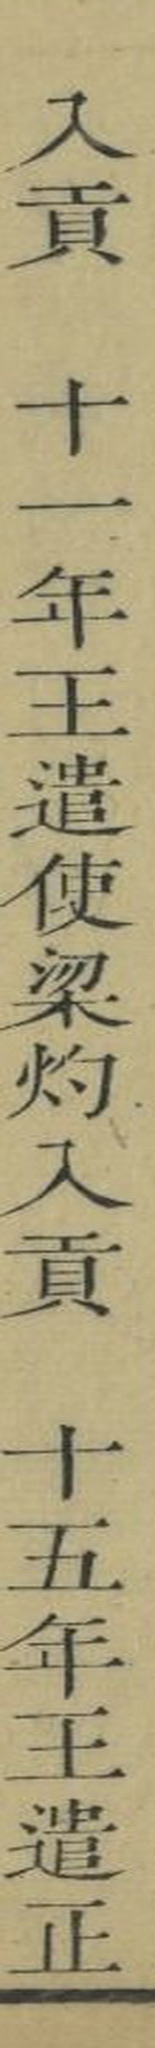入貢十一年王遣使梁灼入貢十五年王遣正
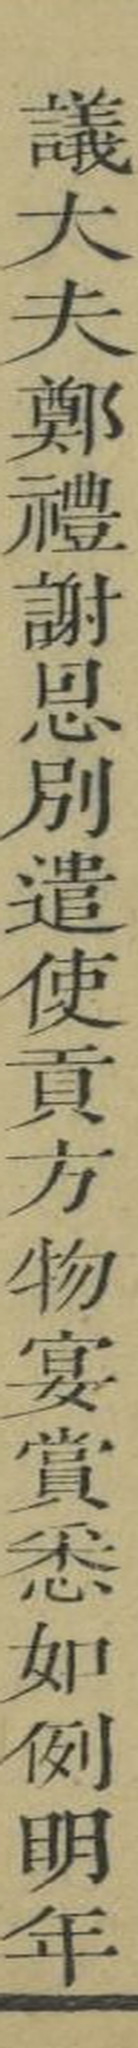議大夫鄭礼謝恩別遣使貢方物宴賞悉如例明年
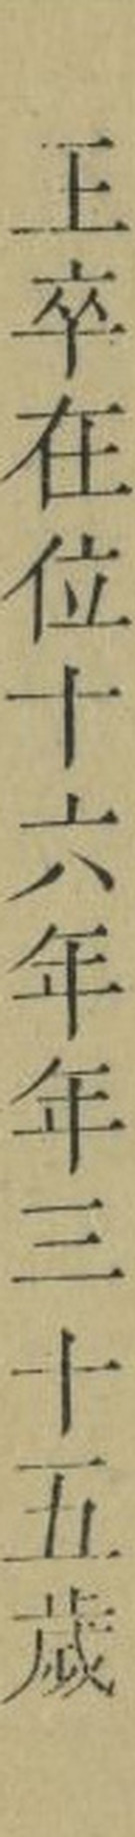王卒在位十六年年三十五歳
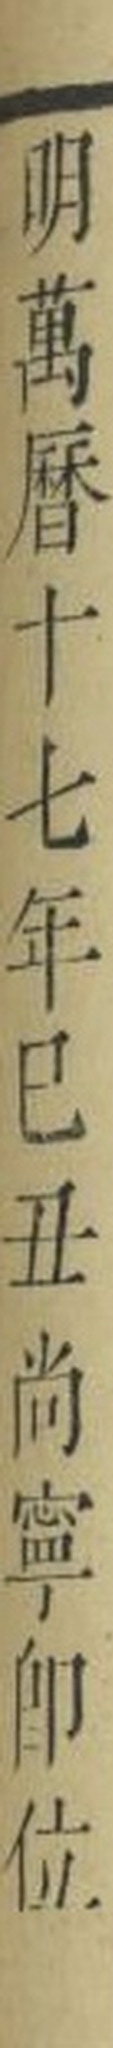明万暦十七年巳丑尚寧即位
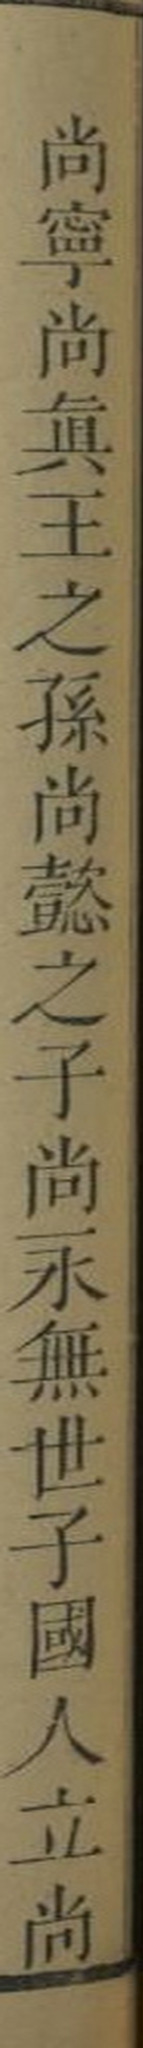尚寧尚真王之孫尚懿之子尚永無世子国人立尚
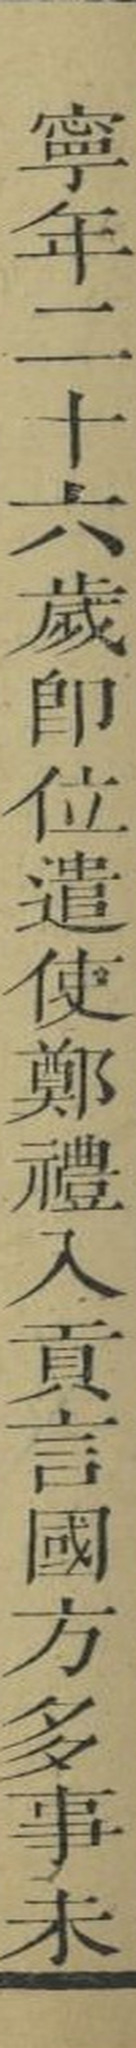寧年二十六歳即位遣使鄭礼入貢言国方多事未
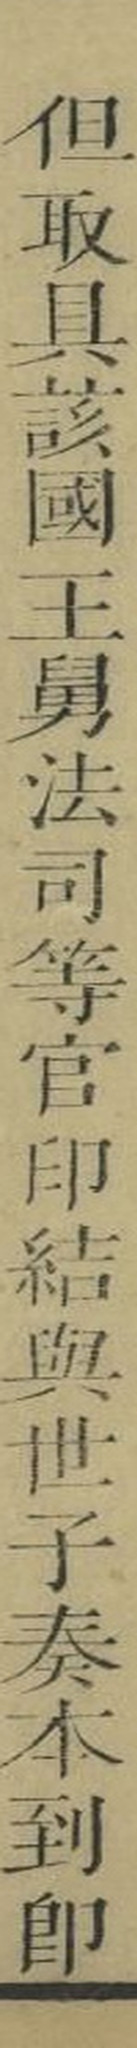但取具該国王舅法司等官印結与世子奏本到即
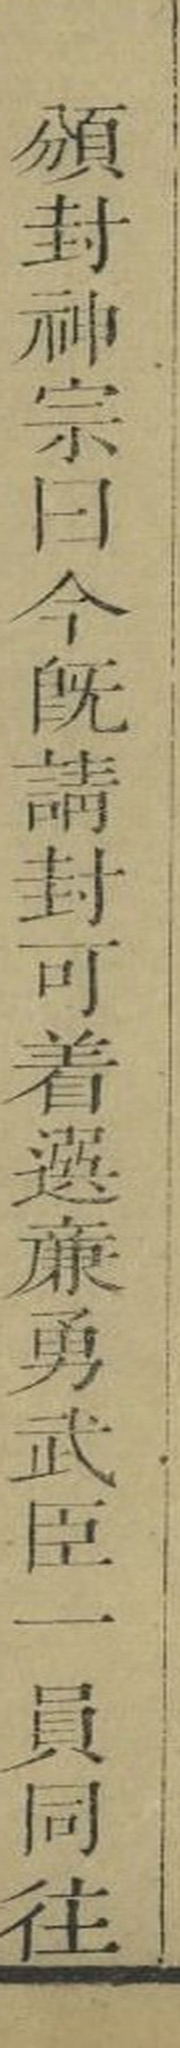頒封神宗曰今既請封可着選廉勇武臣一員同往
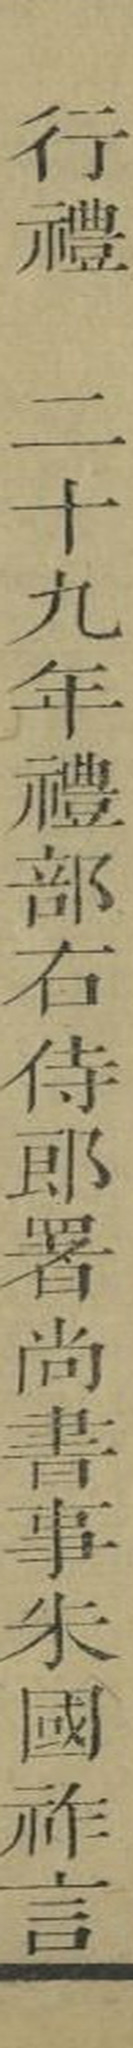行礼二十九年礼部右侍郎署尚書事朱国祚言
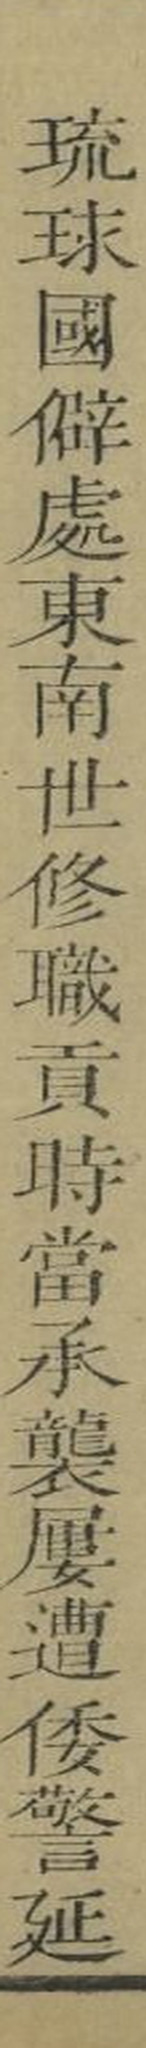琉球国僻処東南世修職貢時当承襲屢遭倭警延
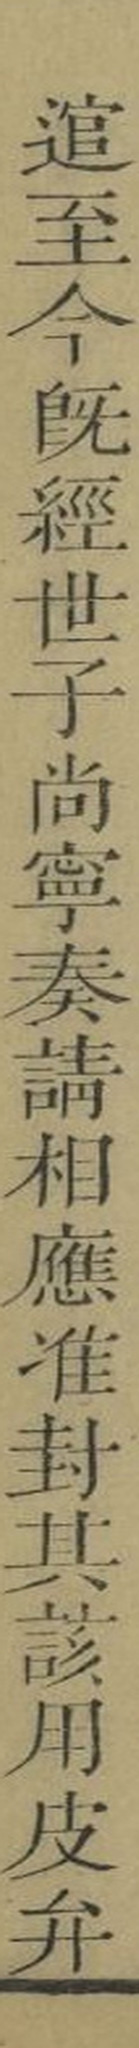逭至今既経世子尚寧奏請相応准封其該用皮弁
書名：中山伝信録 巻三
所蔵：University of the Ryukyus Library
